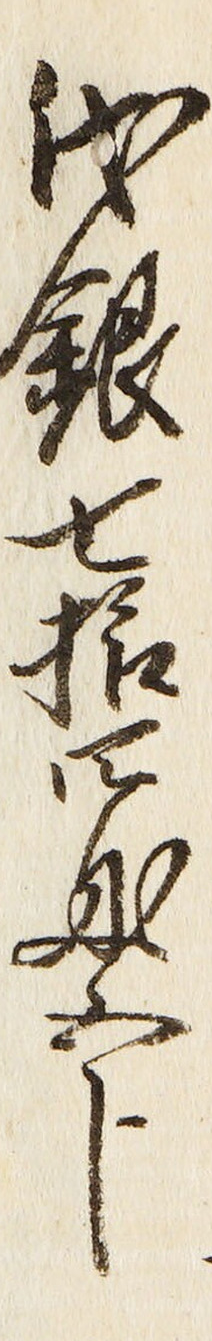代銀七拾四匁五歩
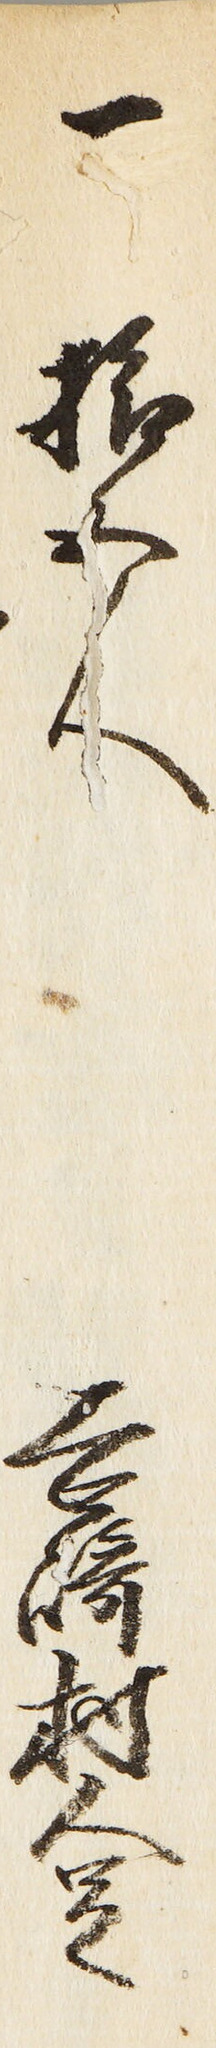一拾五人谷崎村人足
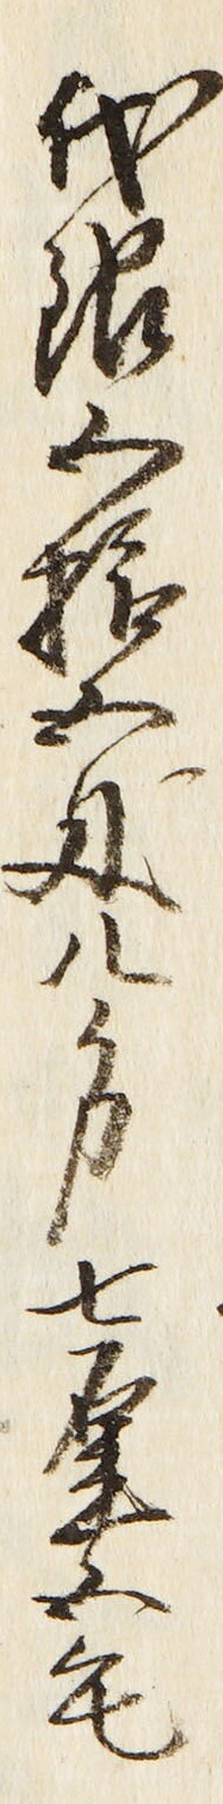代銀五拾五匁八分七厘五毛
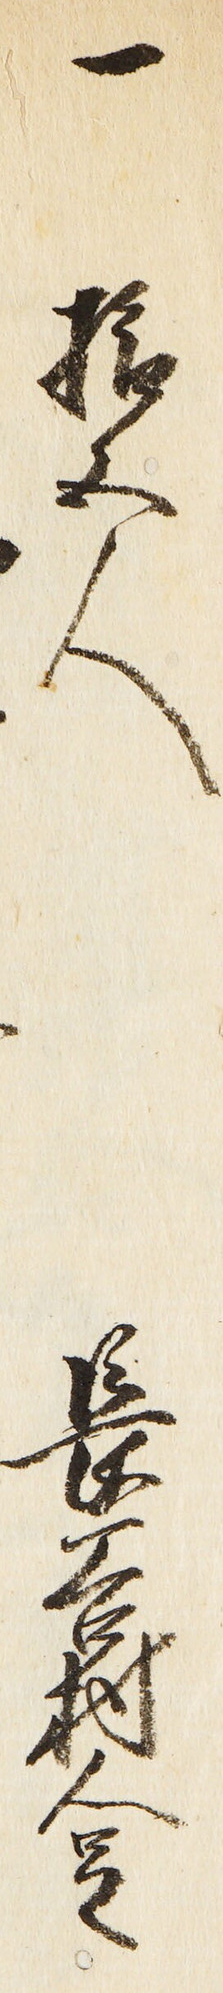一拾五人長谷村人足

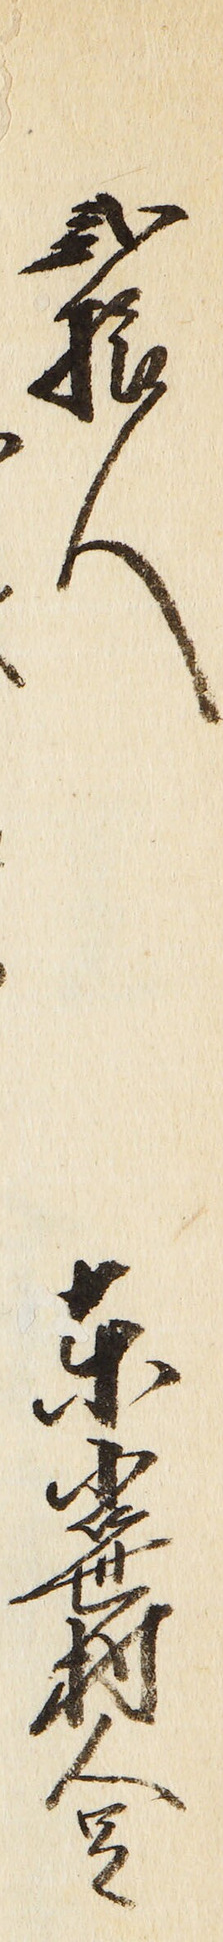一弐拾人東小笹村人足
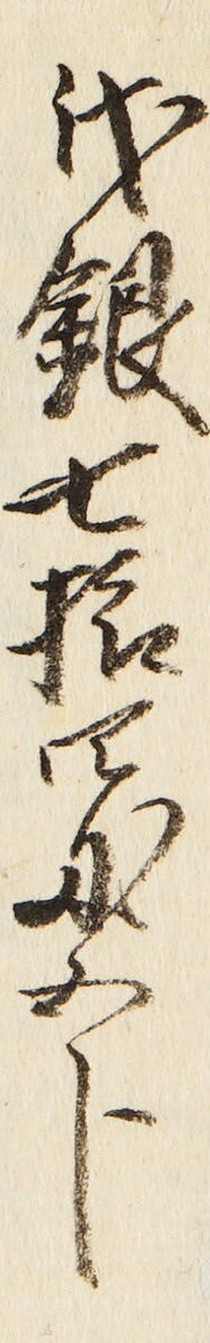代銀七拾四匁五歩
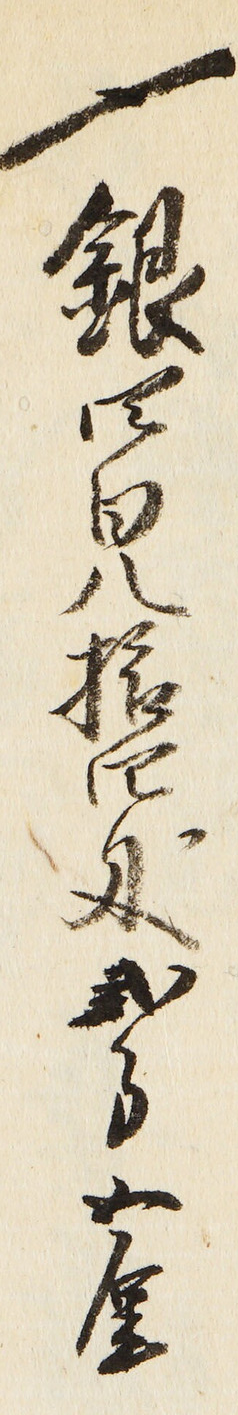〆銀四百八拾四匁弐分五厘
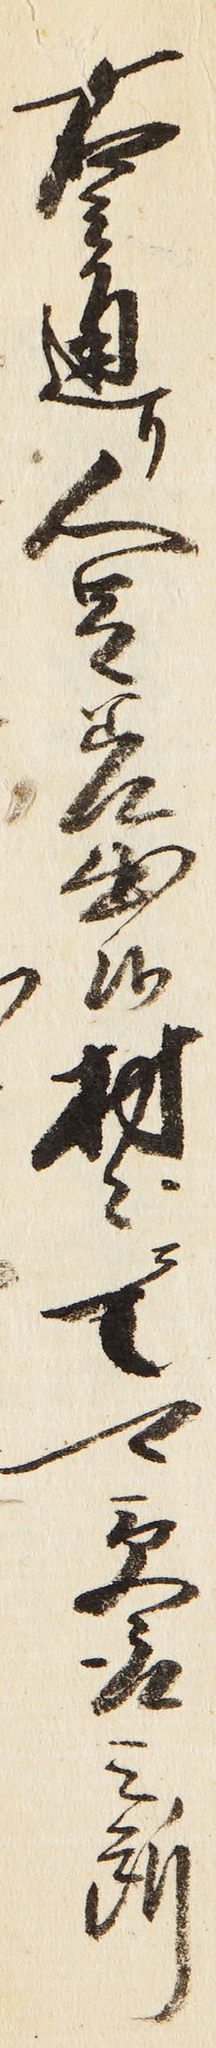右之通り人足差出候村々ニて可受取之所
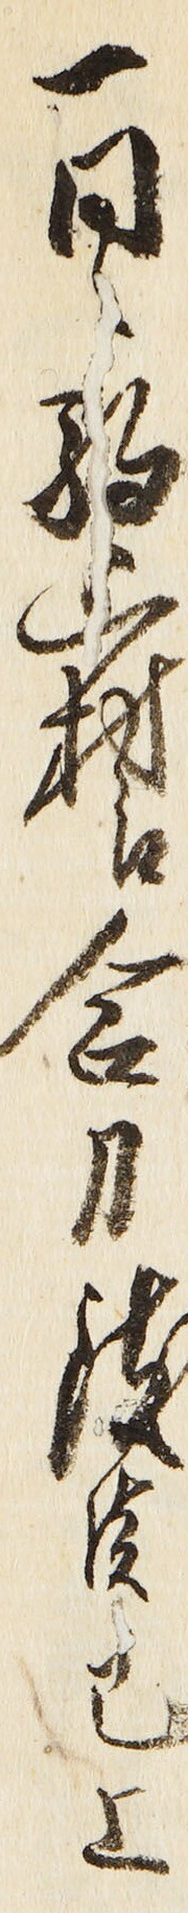一同駒込村江合力致候已上
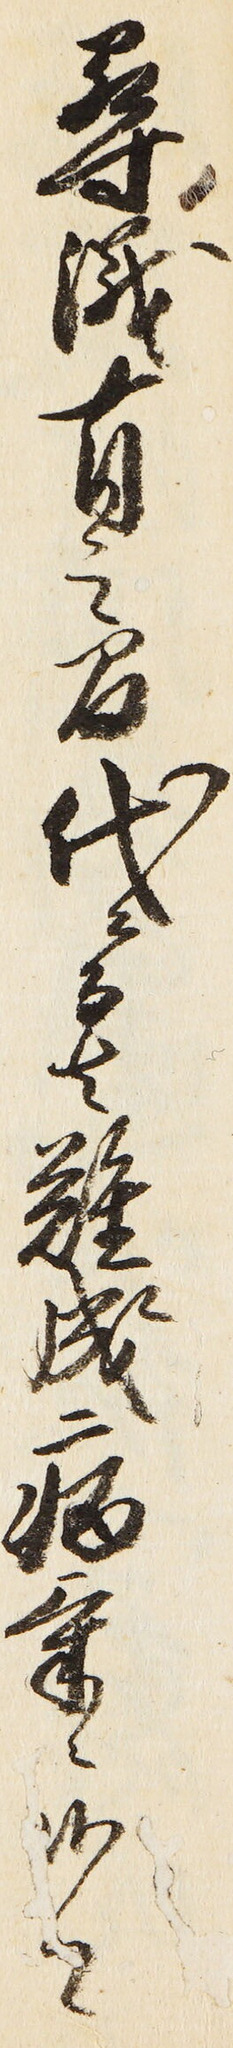尋儀有之間代ニ而者難成病気ニ候ハヽ
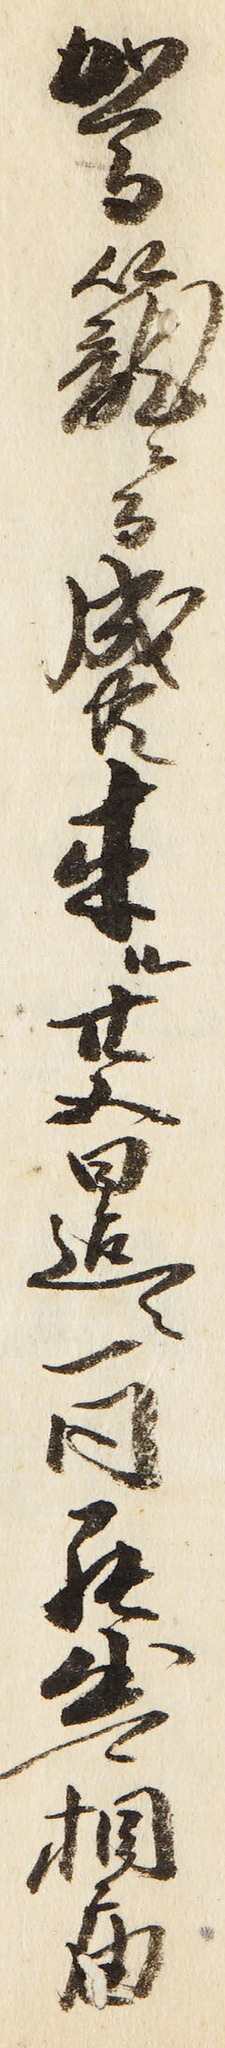駕籠ニ而成共来ル廿五日迄ニ一同罷出可相届
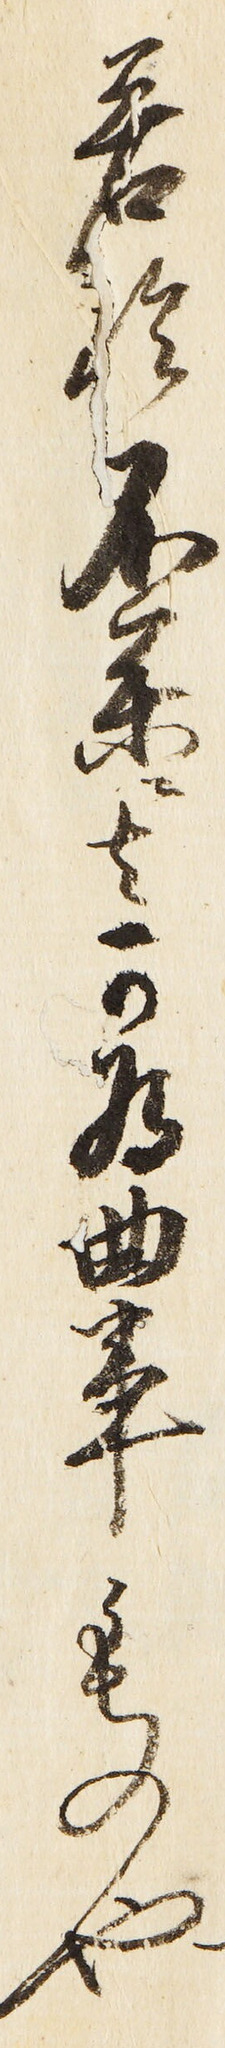若於不参ニ者可為曲事もの也
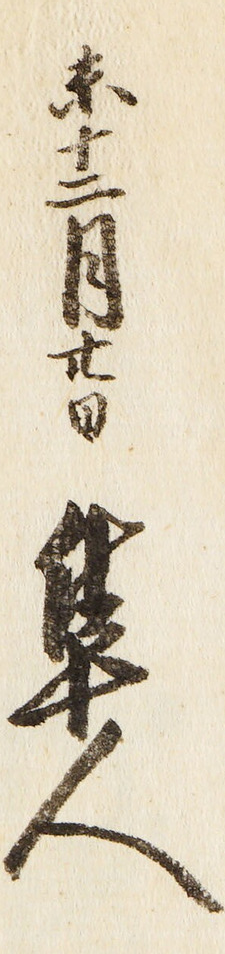未十二月廿日隼人
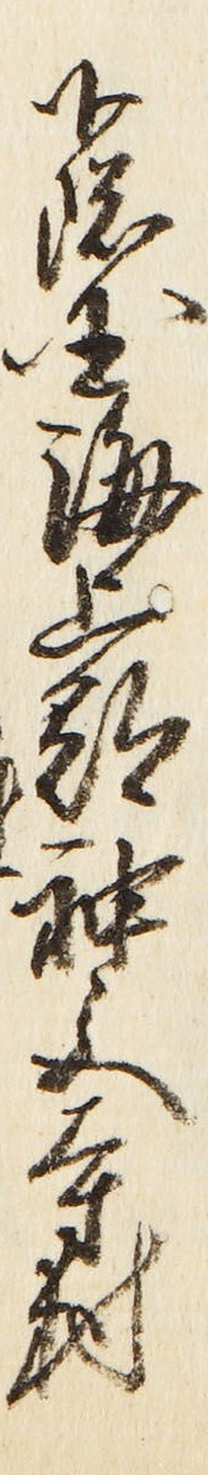下総国海上郡神宮寺村
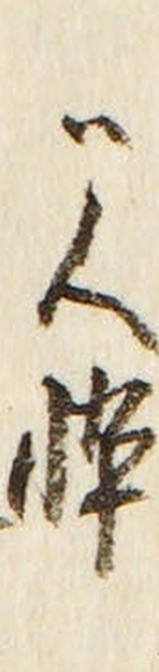同人忰
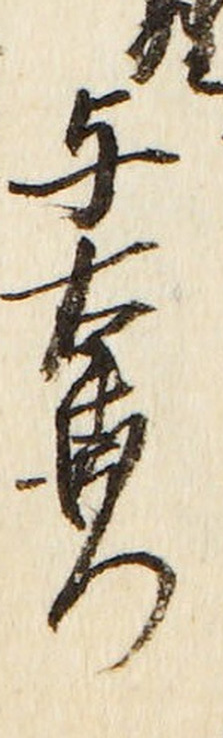与右衛門
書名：難船一件記録
